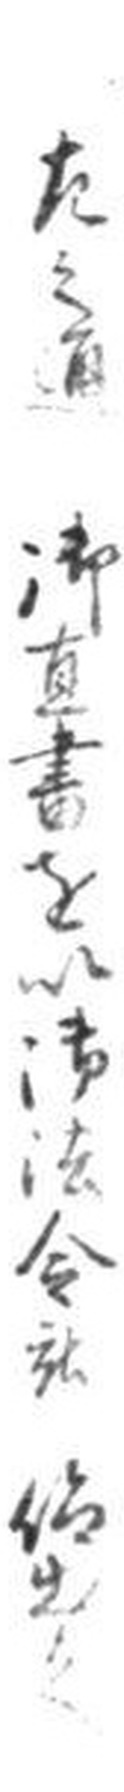左之通御直書を以御法令被仰出之
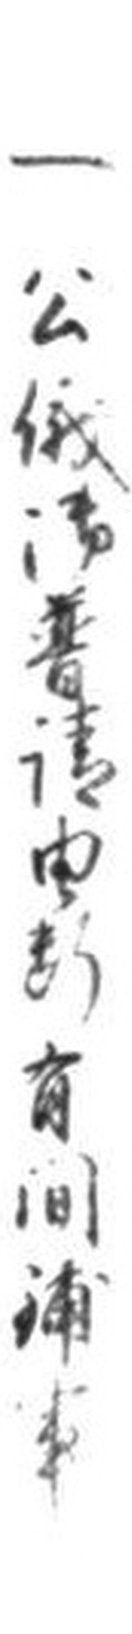一公儀御普請由断有間鋪事
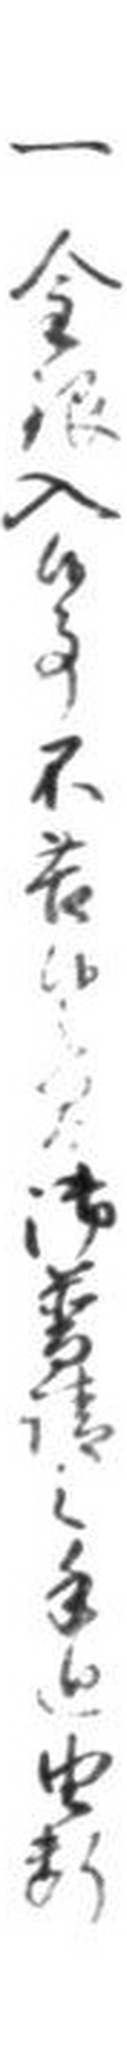一金銀入候事不苦候之間御普請之手廻由断
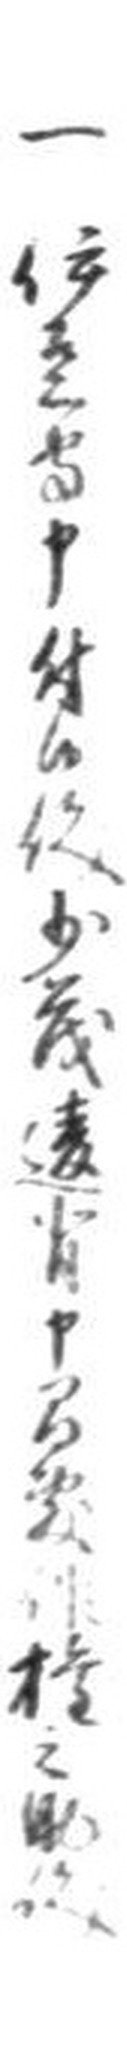一伊豆守申付候儀少も違背申間敷候権之助儀
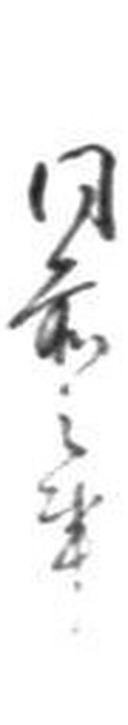同前之事
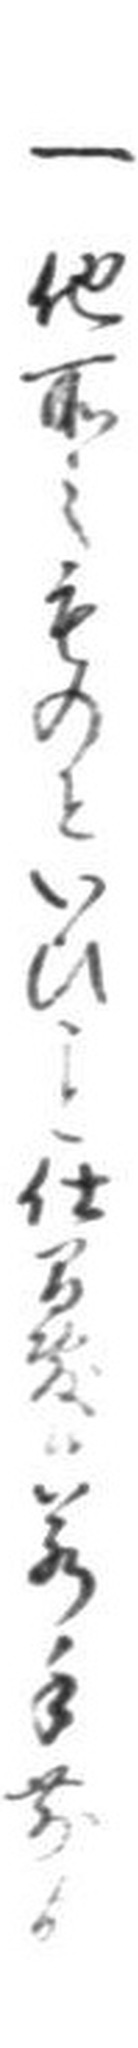一他所之ものといひこと仕間敷候若手前ゟ
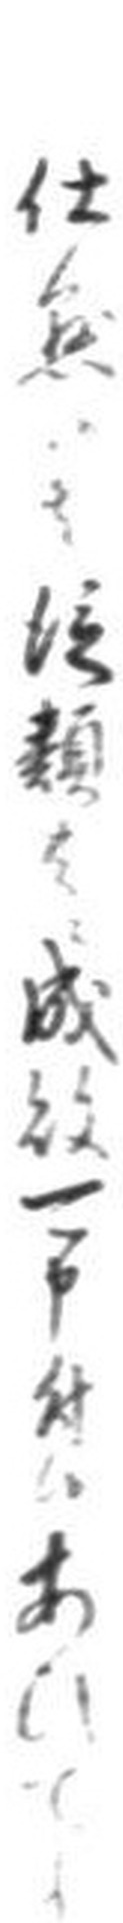仕懸候は従類共ニ成敗可申付候あひてより
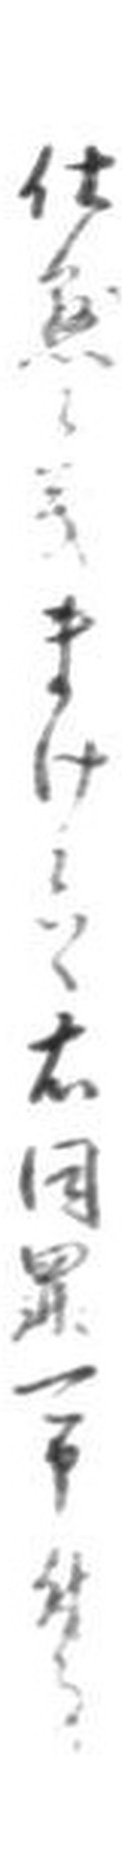仕懸候もまけ候はゝ右同罪可申付事
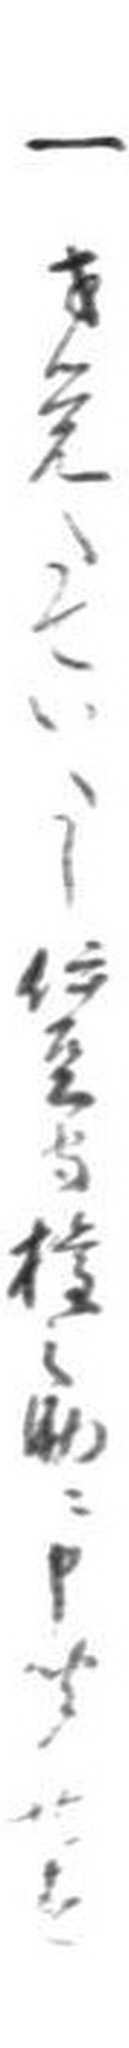一才覚たていたし伊豆守権之助ニ申聞
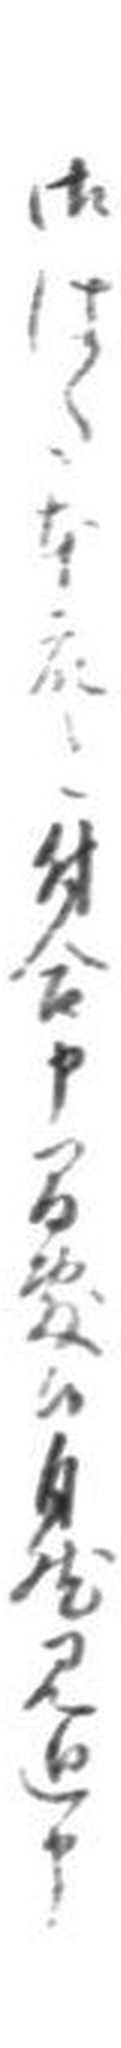御はた本衆と付合申間敷候自然見廻申
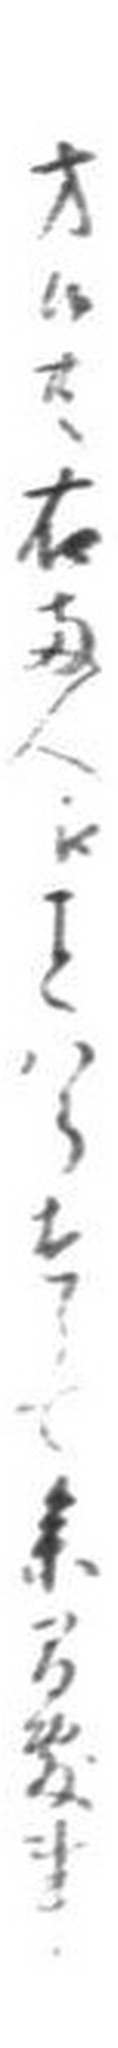方候共右両人江ことはらすして参間敷事

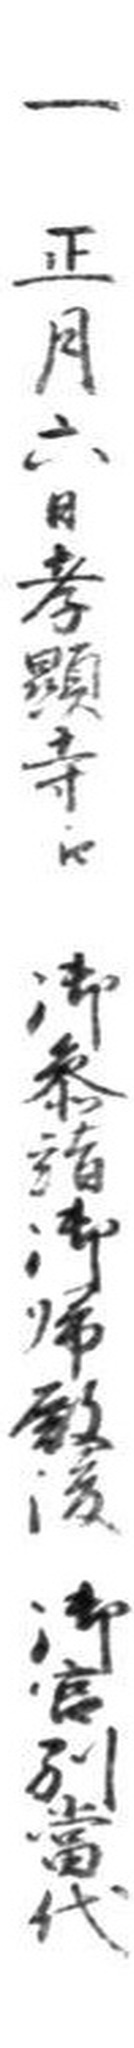一正月六日孝顕寺江御参詣御帰殿後御宮別當代
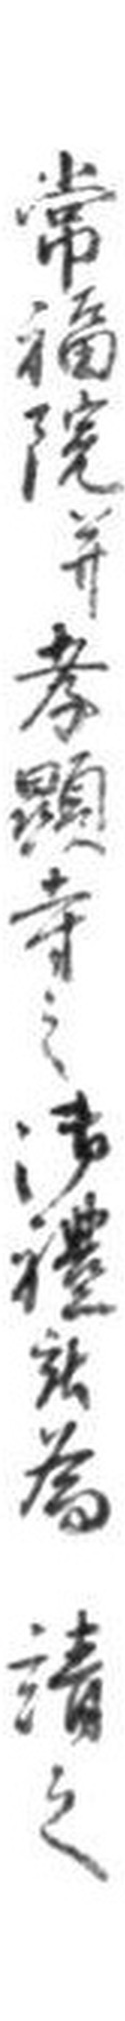常福院并孝顕寺之御礼被為請之
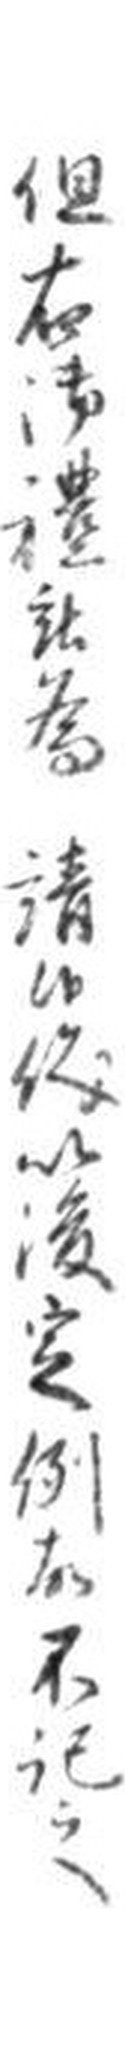但右御礼被為請候儀以後定例故不記之
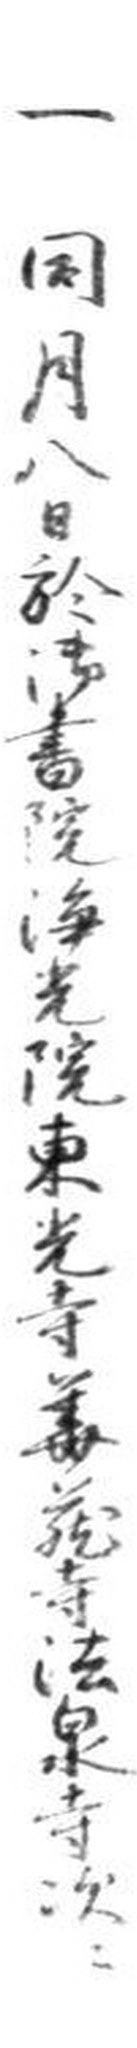一同月八日於御書院浄光院東光寺華蔵寺法泉寺次ニ
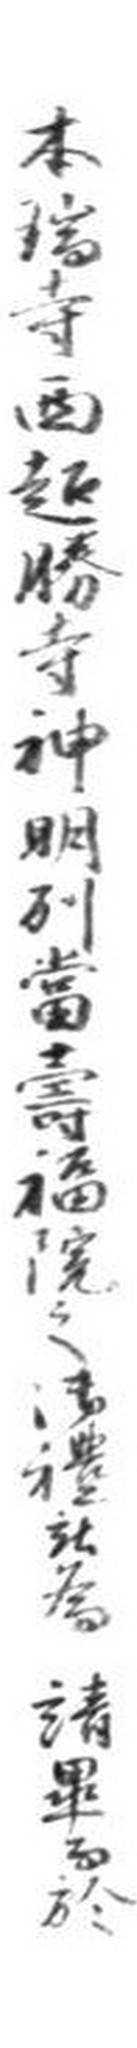本瑞寺西超勝寺神明別當寿福院之御礼被為請畢而於
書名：家譜 三 忠昌公 従慶長八年到寛永六年
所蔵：福井県文書館 Fukui Prefectural Archives
